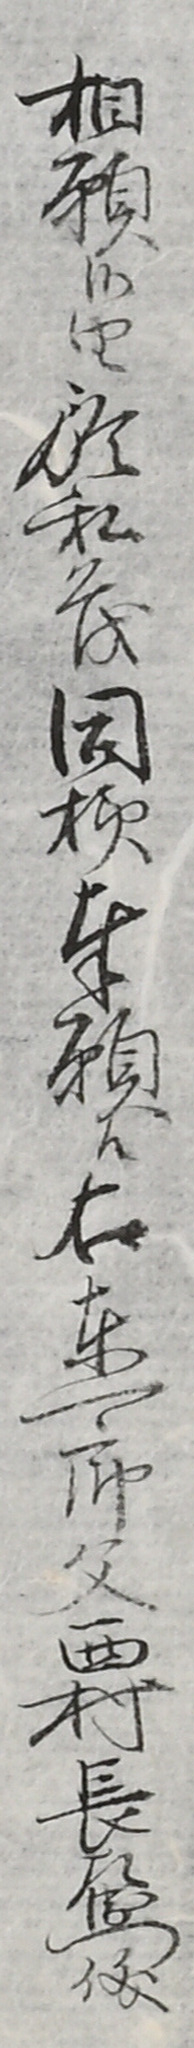相願候由於私も同様奉願候右東一郎父西村長左衛門儀
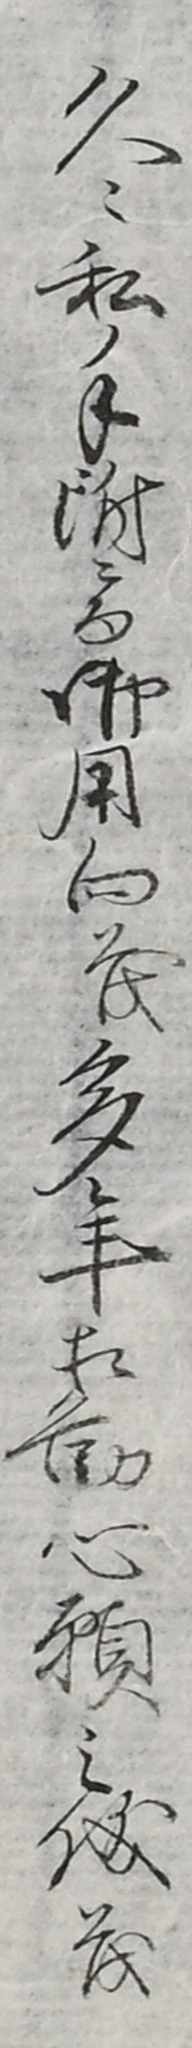久々私手附にて御用向も多年相勤心願之儀も
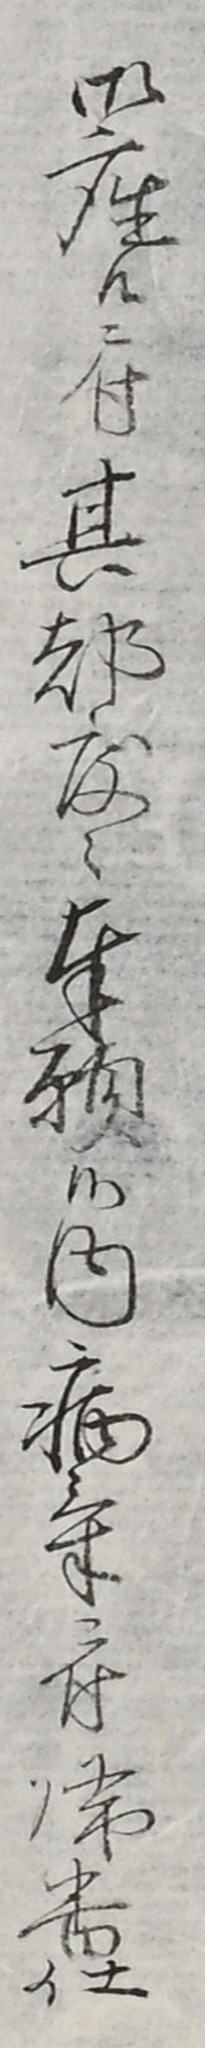御座候に付其都度々奉願候内病気に付帰番仕
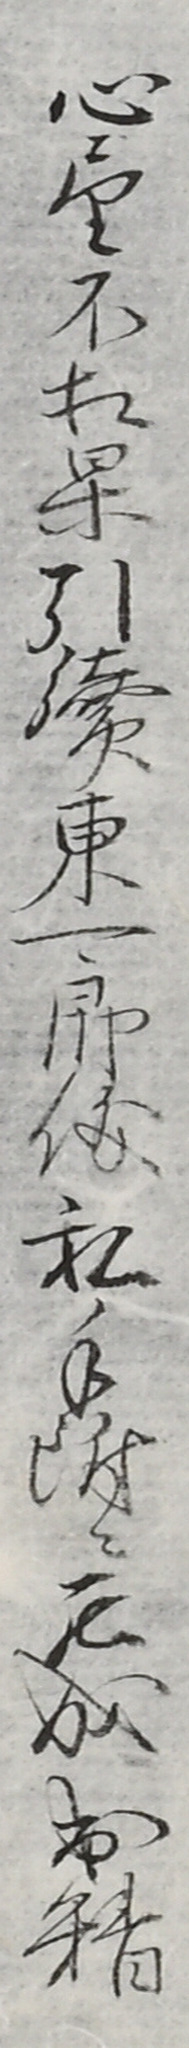心望不相果引続東一郎儀私手附に罷成出精
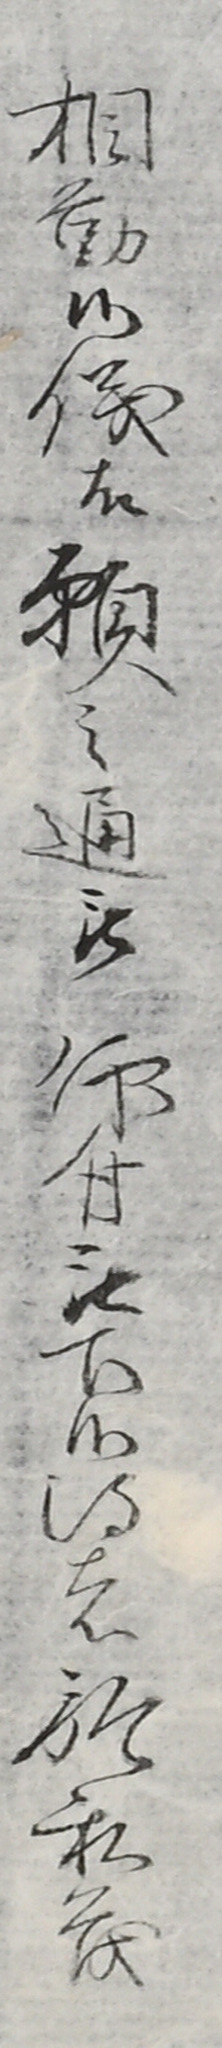相勤候儀故願之通被仰付被下候得は於私も
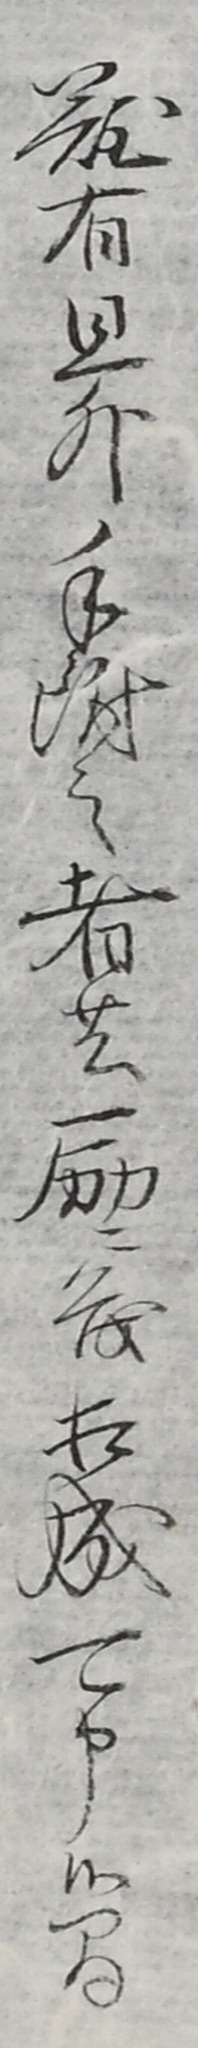難有且外手附之者共励にも相成可申候間

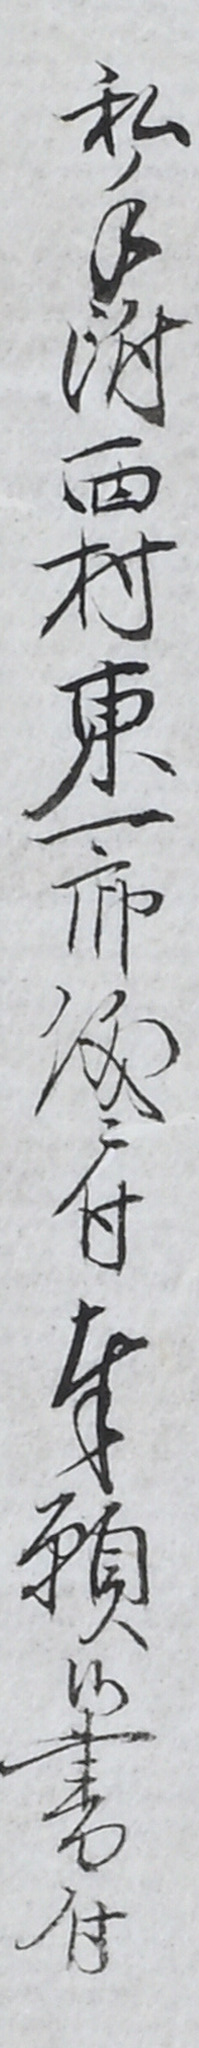私手附西村東一郎儀に付奉願候書付
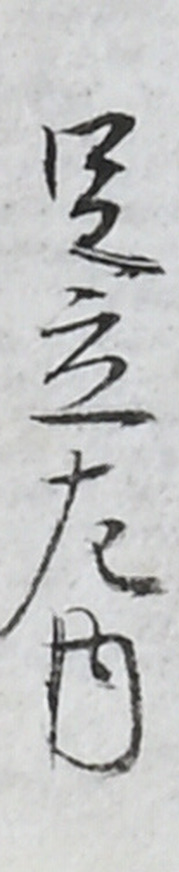足立左内
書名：私手附西村東一郎儀ニ付奉願候書付
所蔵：伊那市立高遠町図書館・合同会社AMANE
